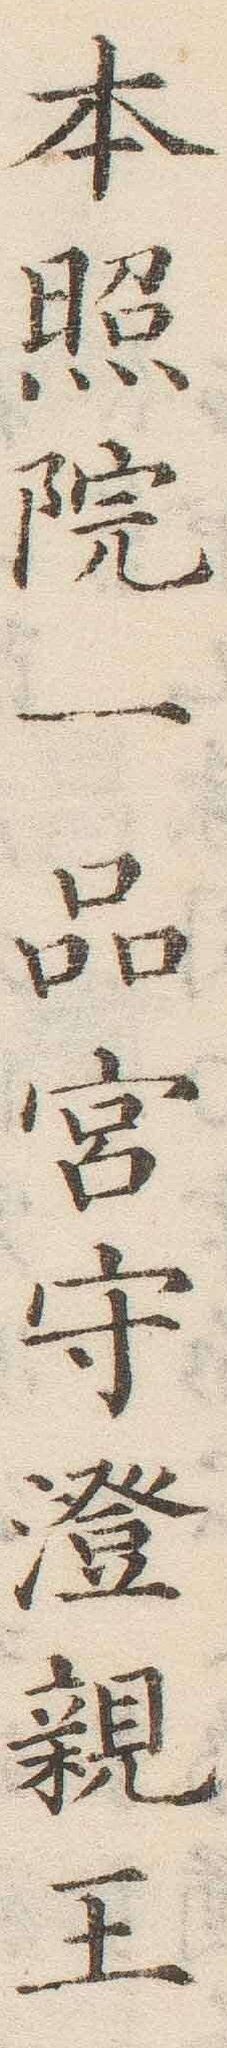解脫院一品宮天眞親王
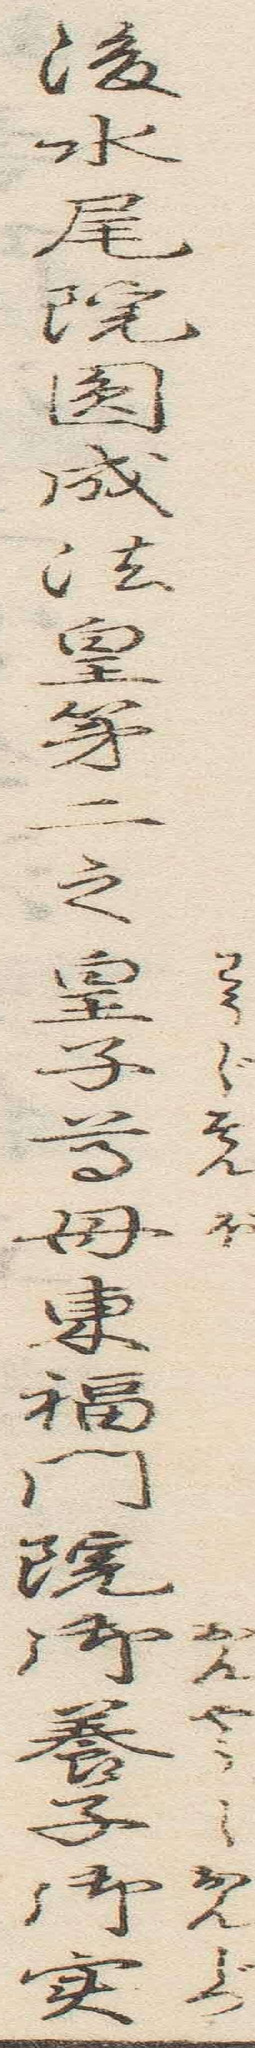後水尾院圓成法皇第二之皇子尊母東福門院御養子御実
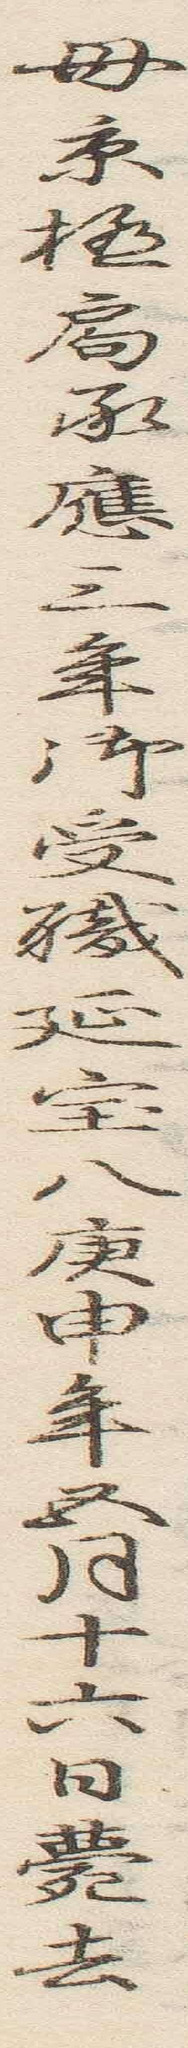母京極承應三年御受職延宝八庚申年五月十六日薨去
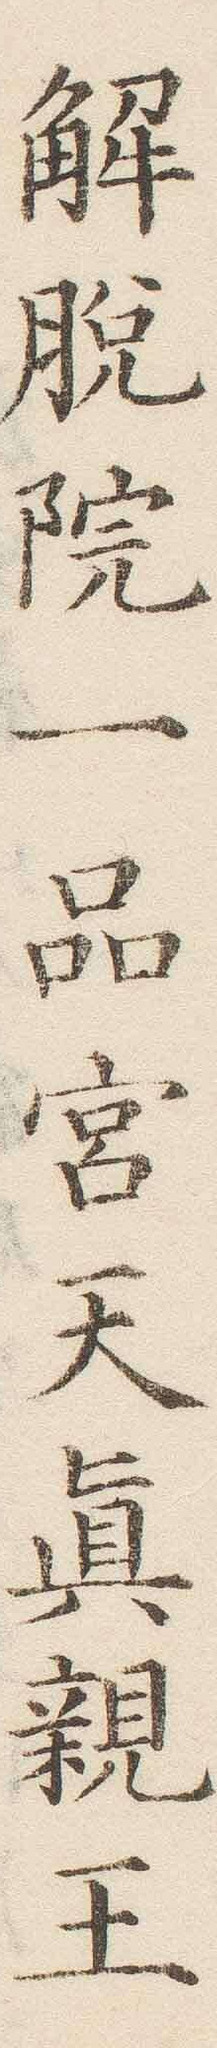解脫院一品宮天眞親王
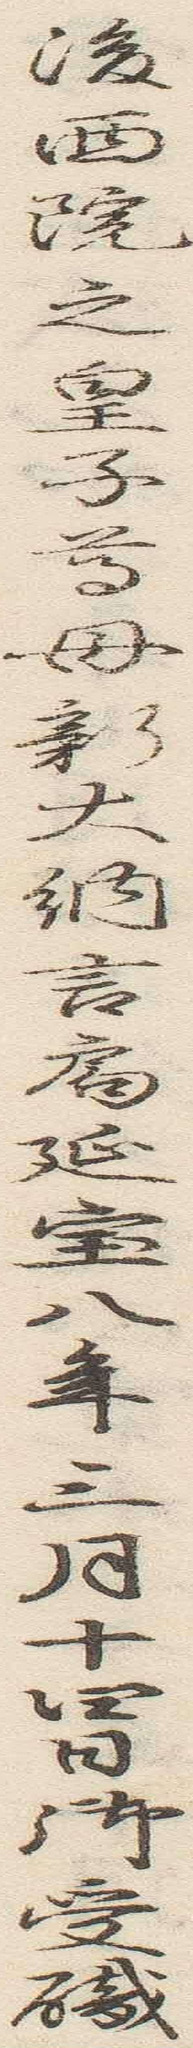後西院之皇子尊母新大納言延宝八年三月十四日御受職
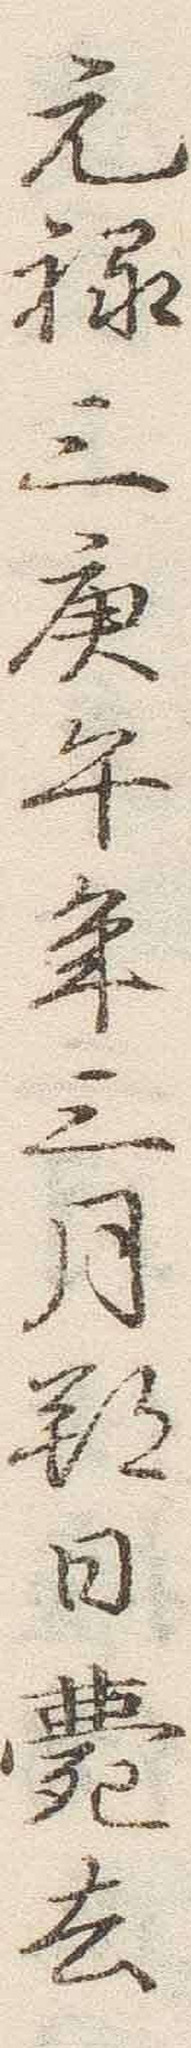元禄三庚午年三月朔日薨去
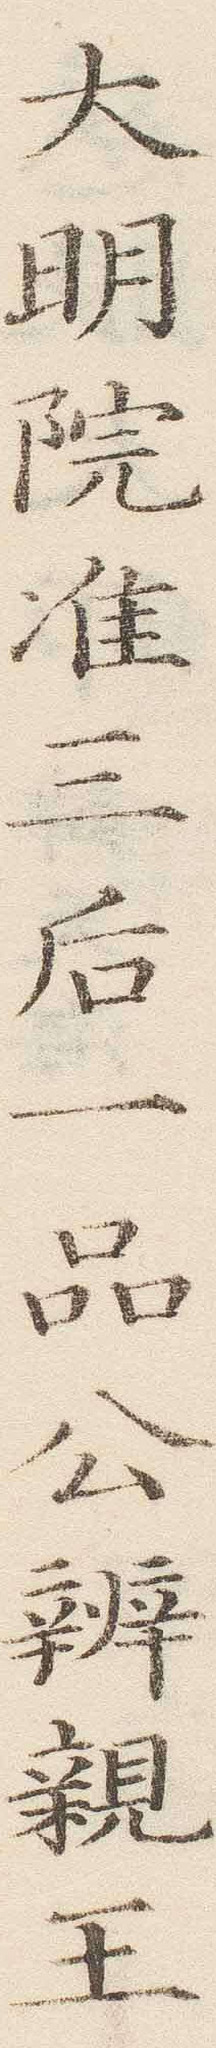大明院准三后一品公辨親王
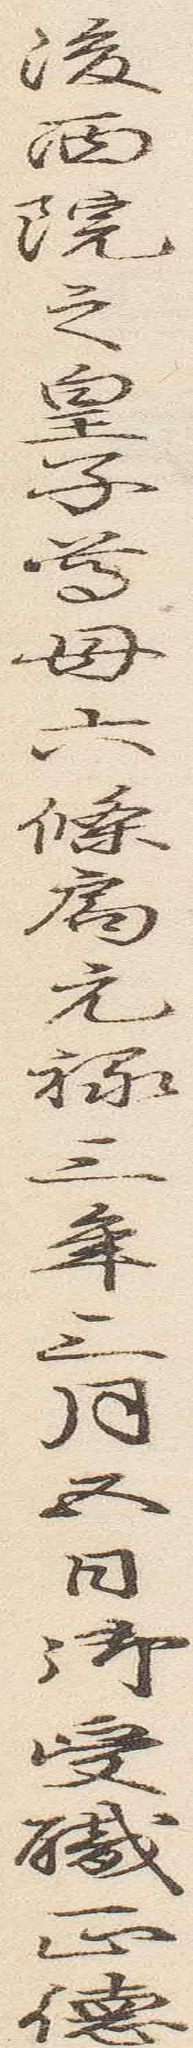後西院之皇子尊母六條元禄三年三月五日御受職正徳
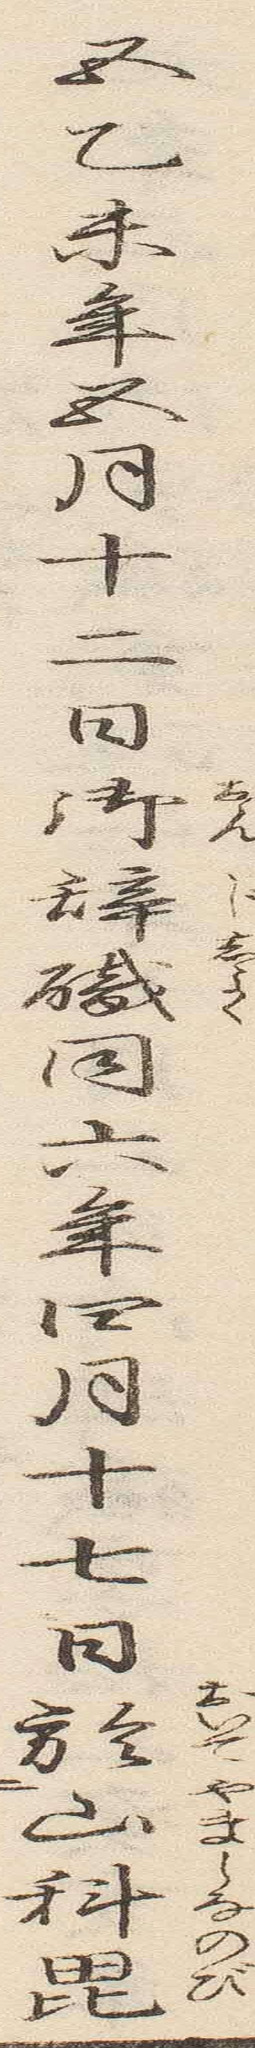五乙未年五月十二日御辞職同六年四月十七日於山階毘
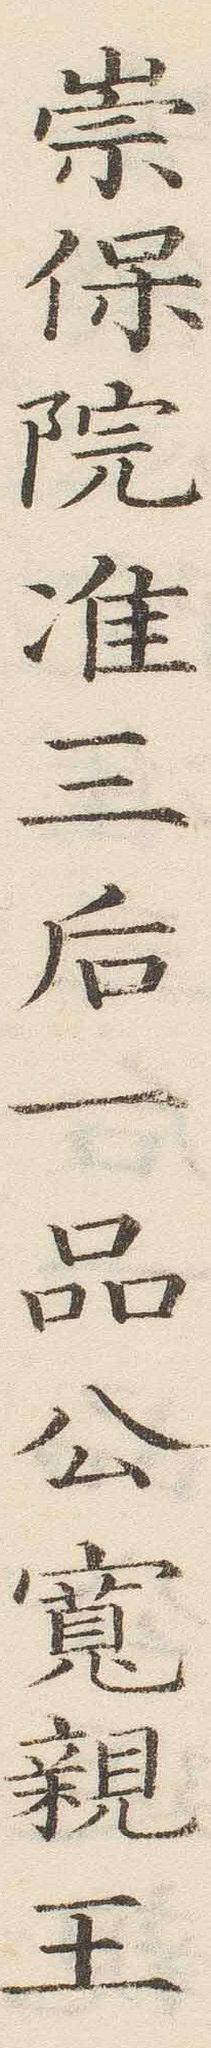崇保院准三后一品公寬親王
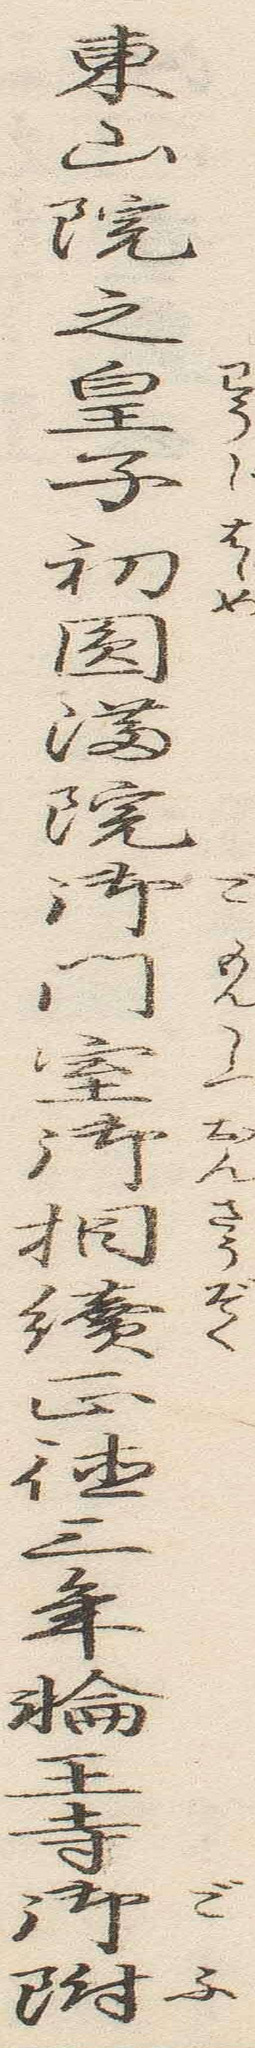東山院之皇子初圓満院御門室御相續正徳三年輪王寺御附
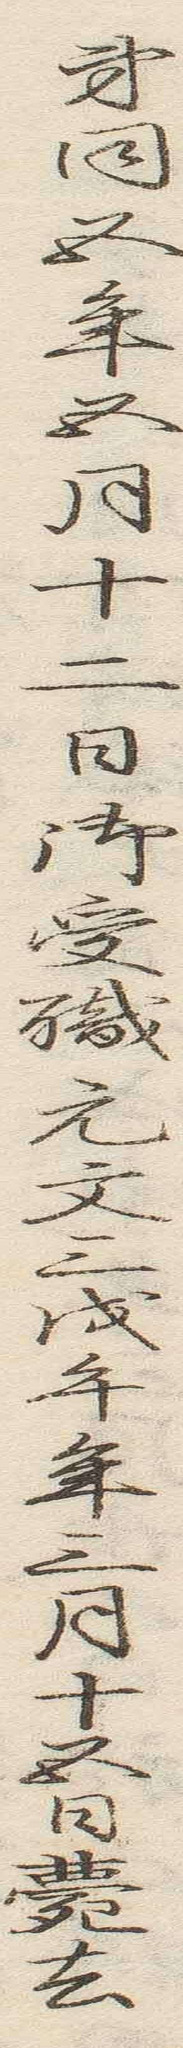㐧同五年五月十二日御受職元文三戊午年三月十五日薨去
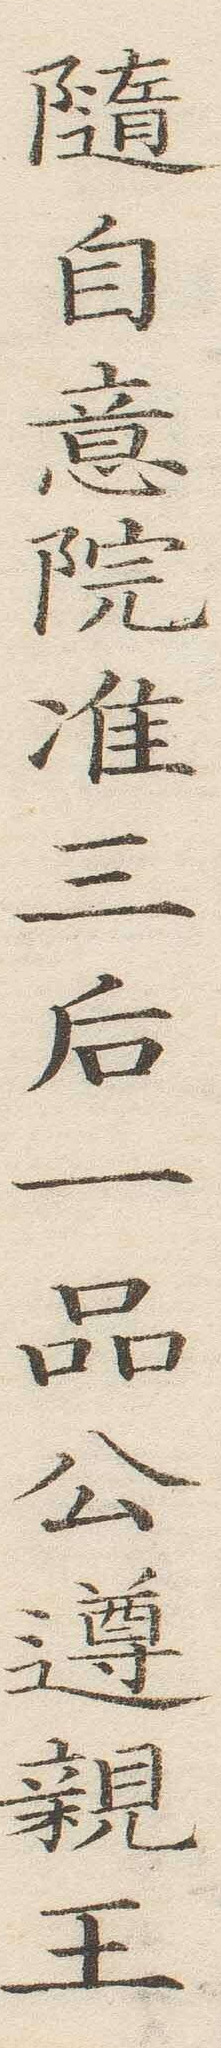隨自意院准三后一品公遵親王
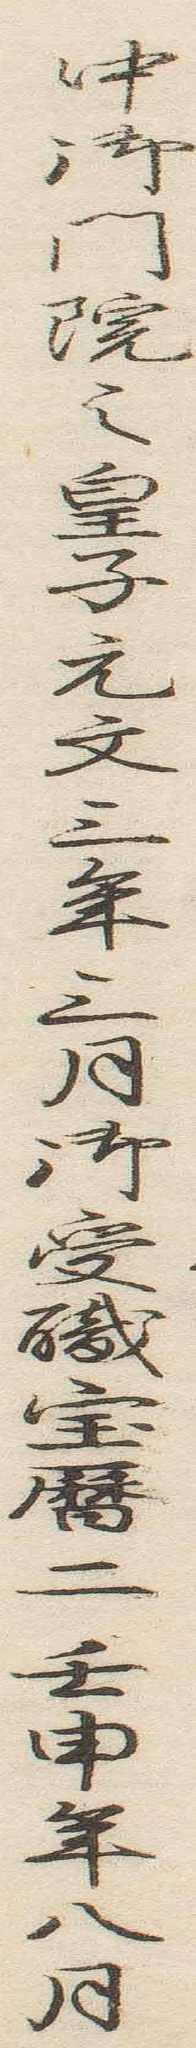中御門院之皇子元文三年三月御受職宝歷二壬申年八月
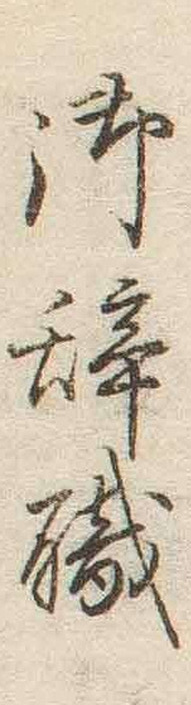御辞職
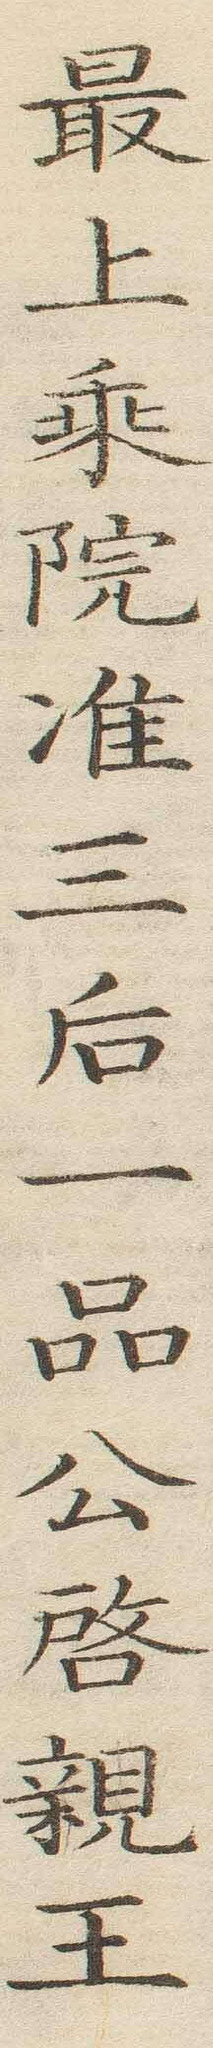最上乘院准三后一品公啓親王
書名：日光山志
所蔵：東京学芸大学附属図書館 国文学研究資料館
